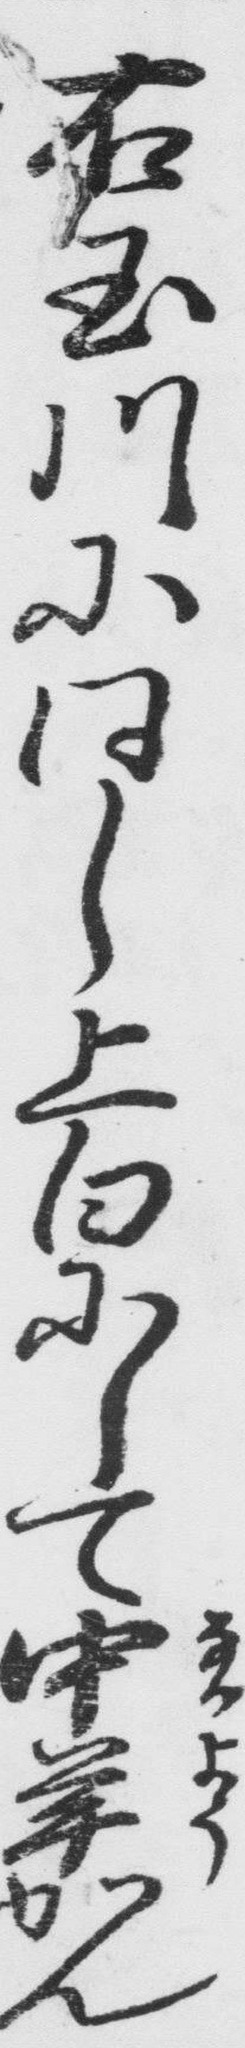右玉川に同し上白にして中羊かん
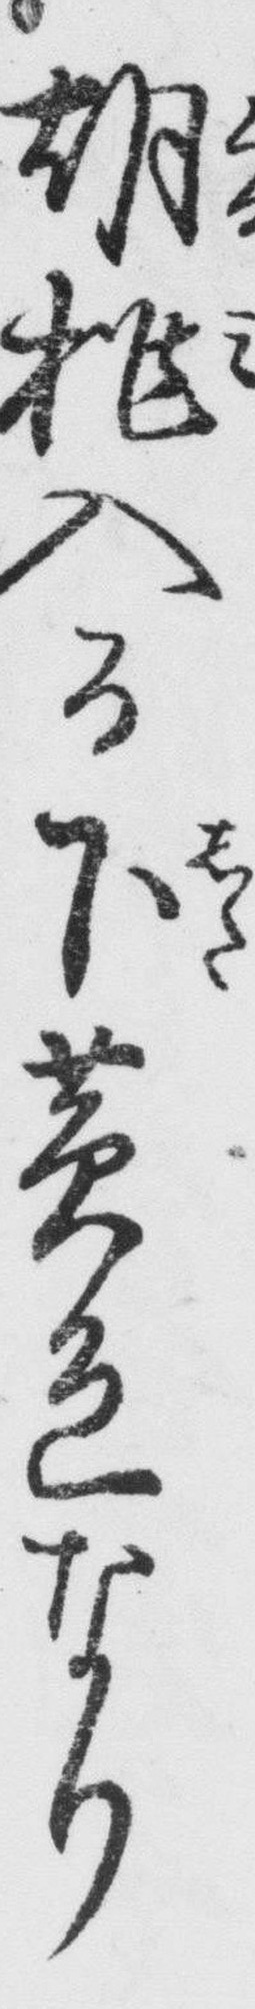胡桃入る下黄色なり
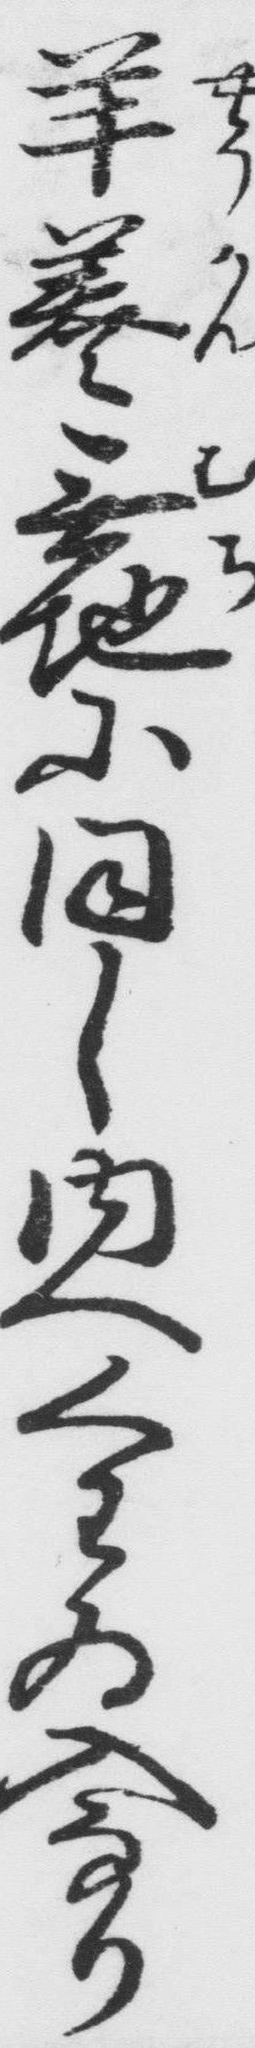羊羹無地に同し内へくわゐ入なり
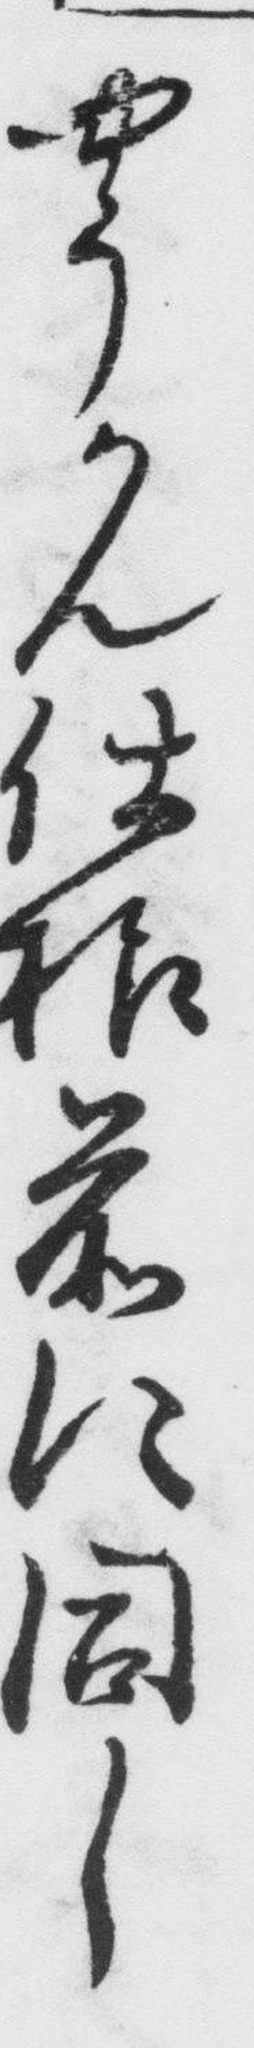やうかん仕様前に同し
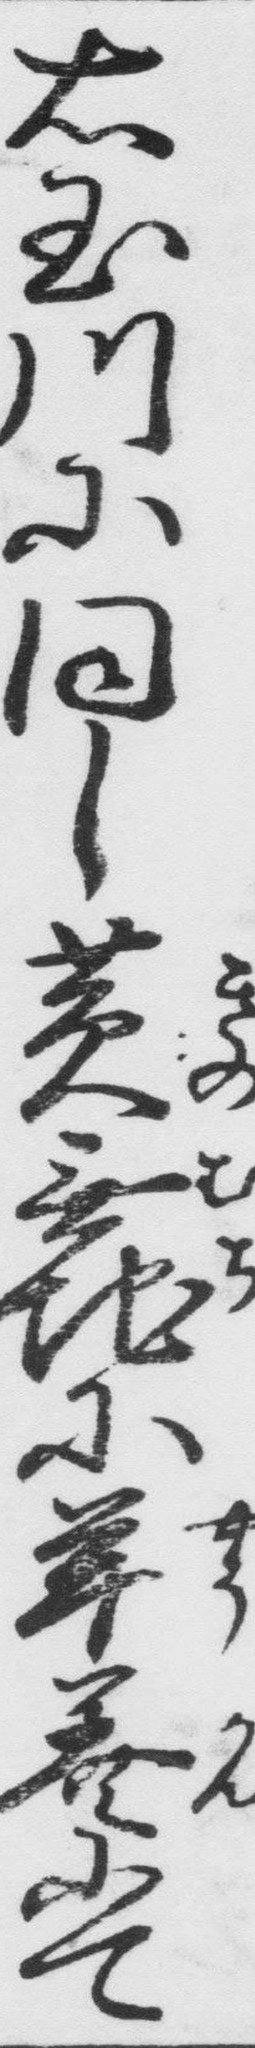右玉川に同し黄無地に羊羹にて
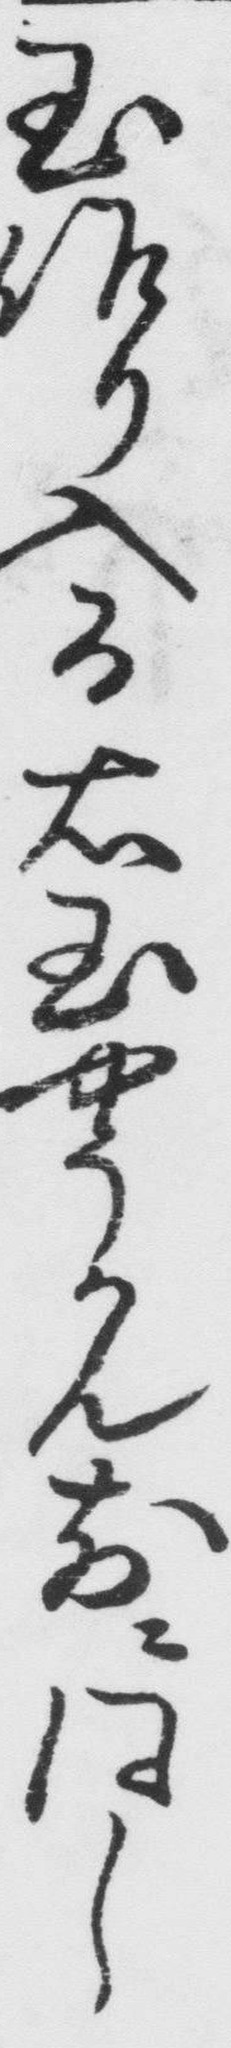玉作り入る右玉やうかん前に同し

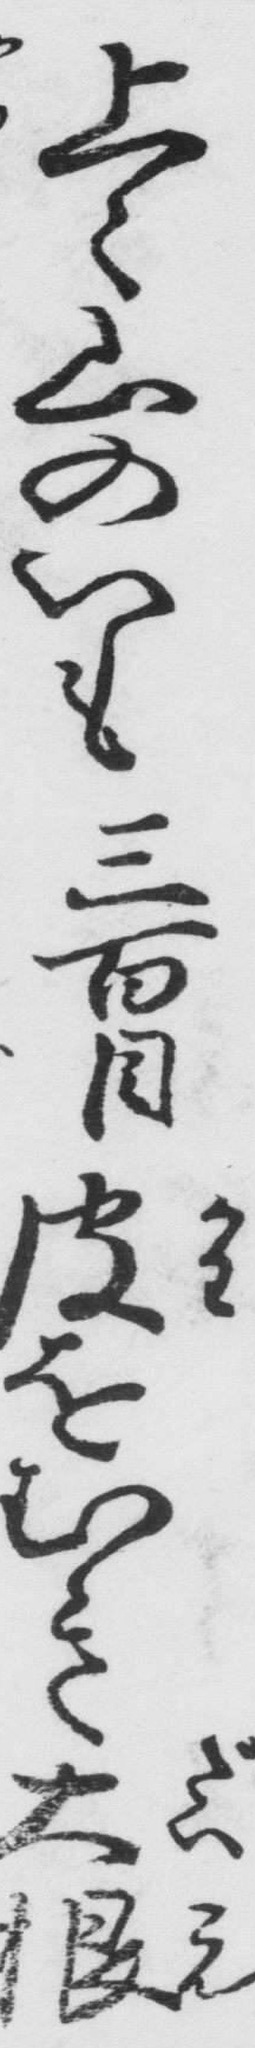上々山のいも三百目皮をむき大根
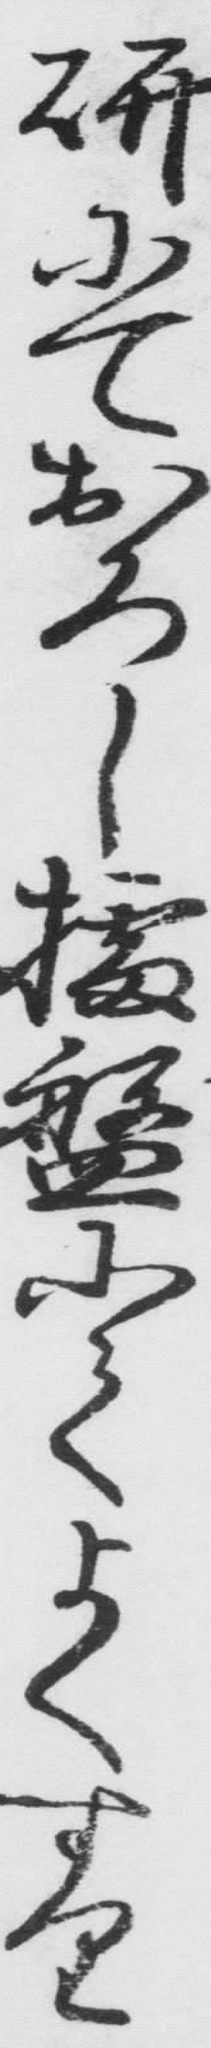研にておろし擂盤にてよくすり
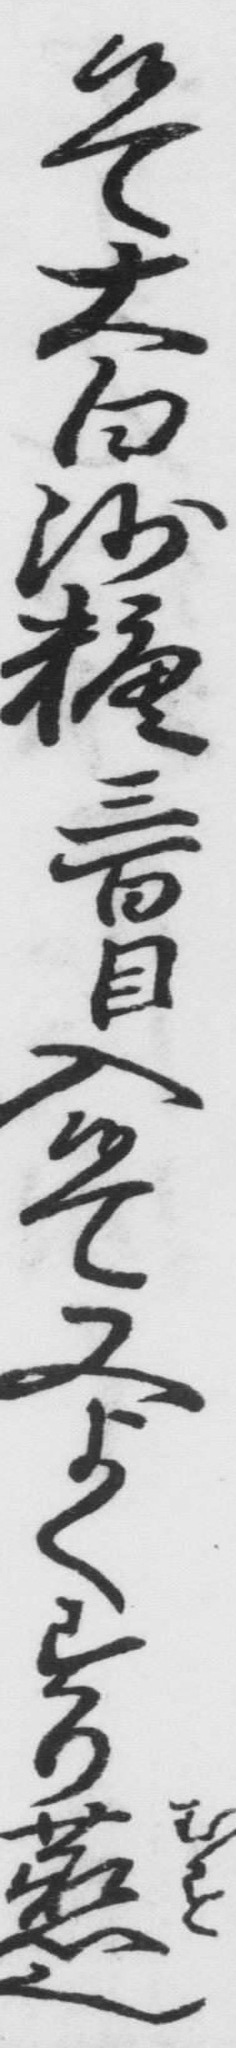候て大白沙糖三百目入候て又よくすり蒸也
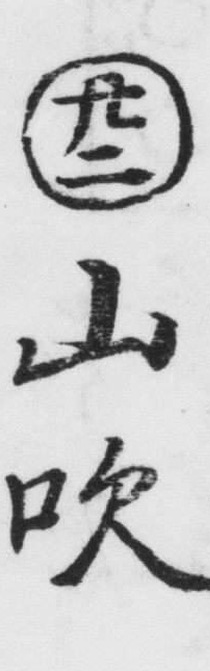(廿二)山吹
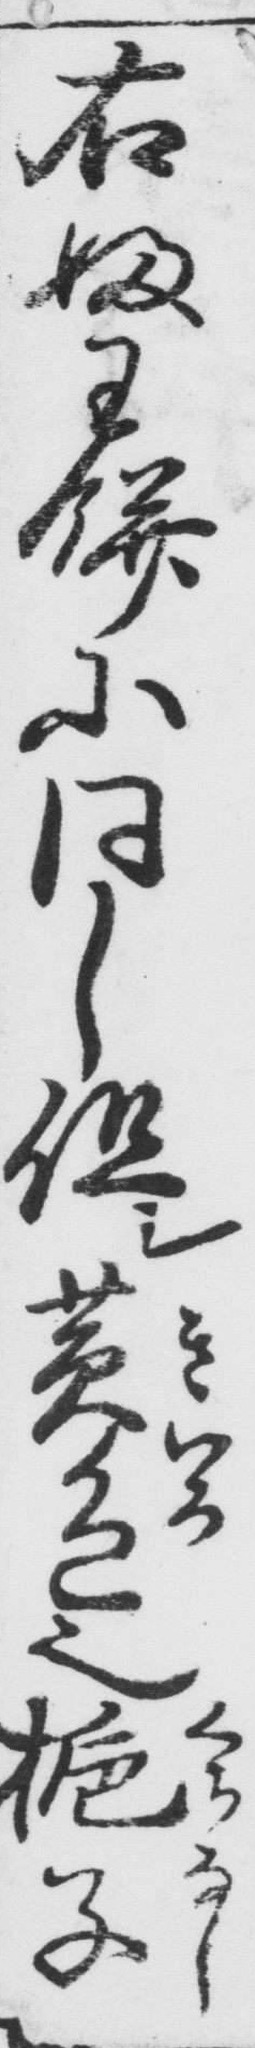右ふわ餅に同し但し黄色也梔子
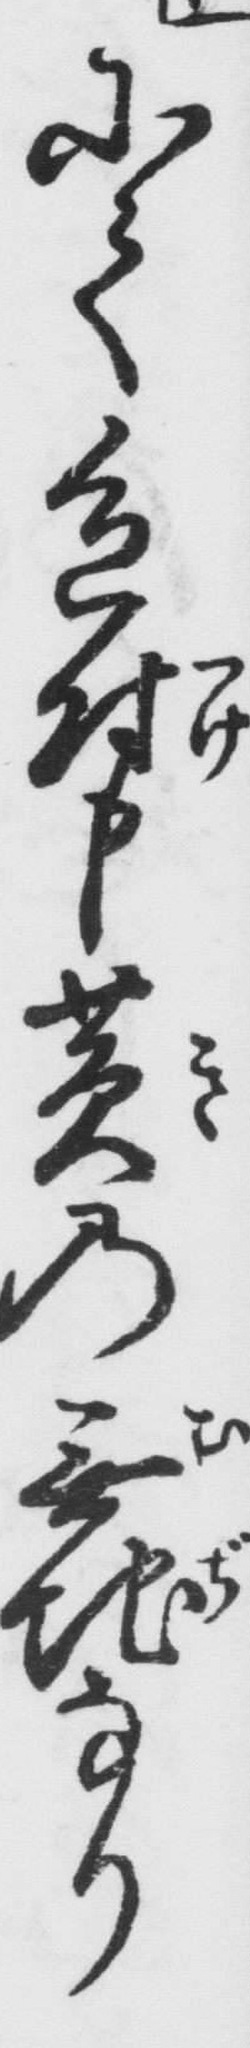にて色付申黄の無地なり
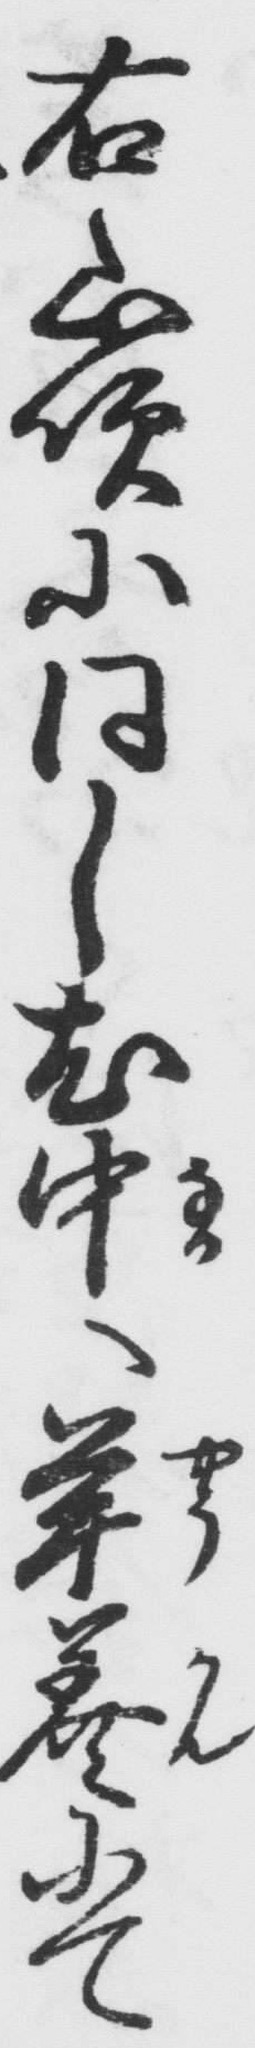右山吹に同し尤中へ羊羹にて
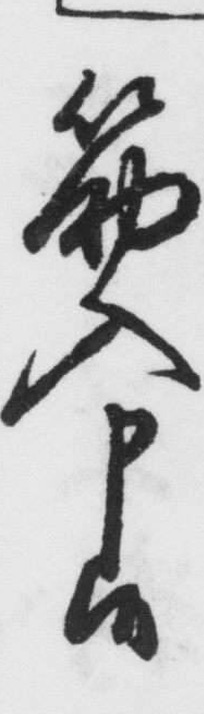筋入申候
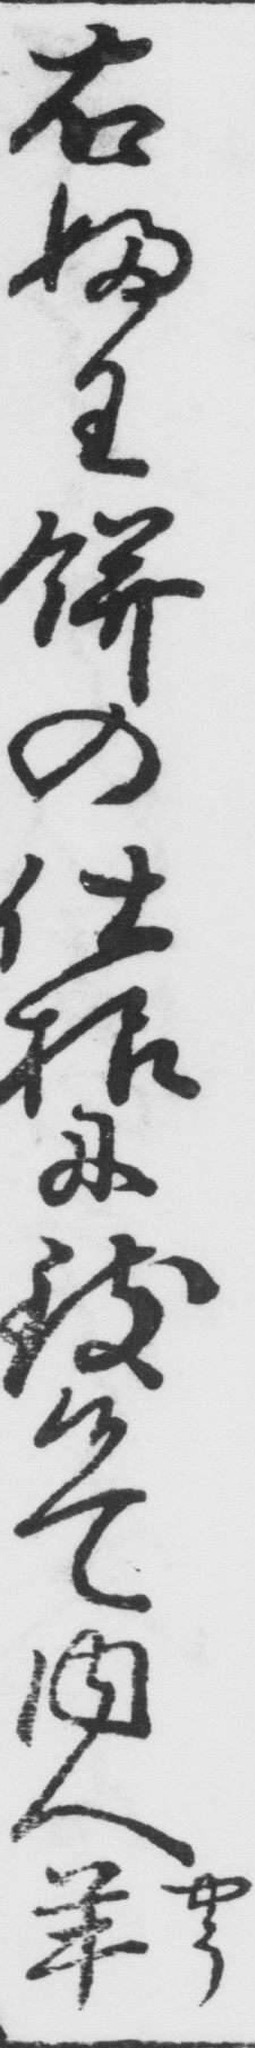右ふわ餅の仕様に致候て内へ羊

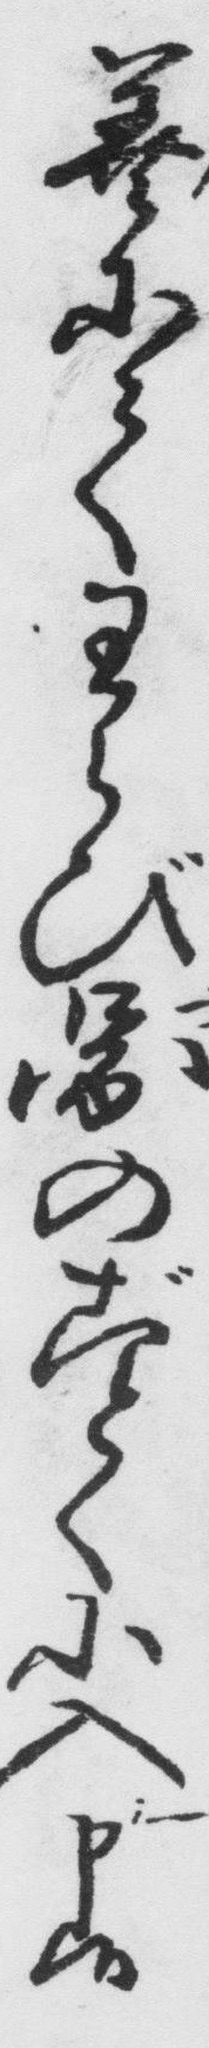羹にてわらび図のごとくに入れ申候
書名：御前菓子図式
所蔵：大阪府立大学学術情報センター 国文学研究資料館
